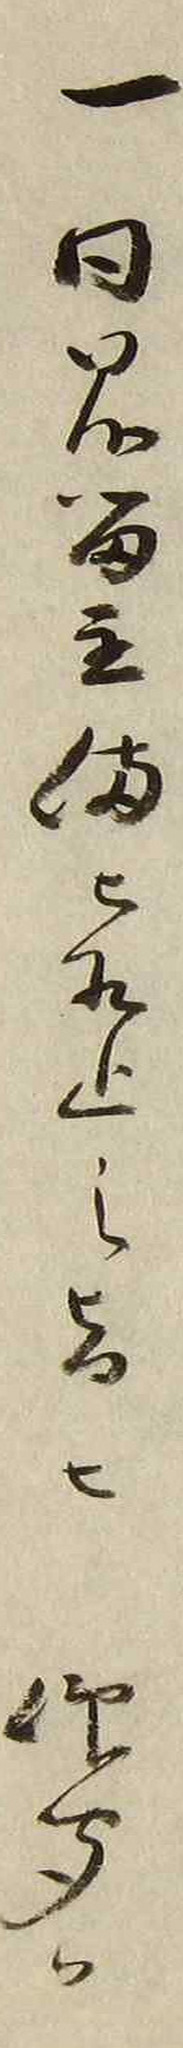一同日御留主備被相止之旨被仰聞候
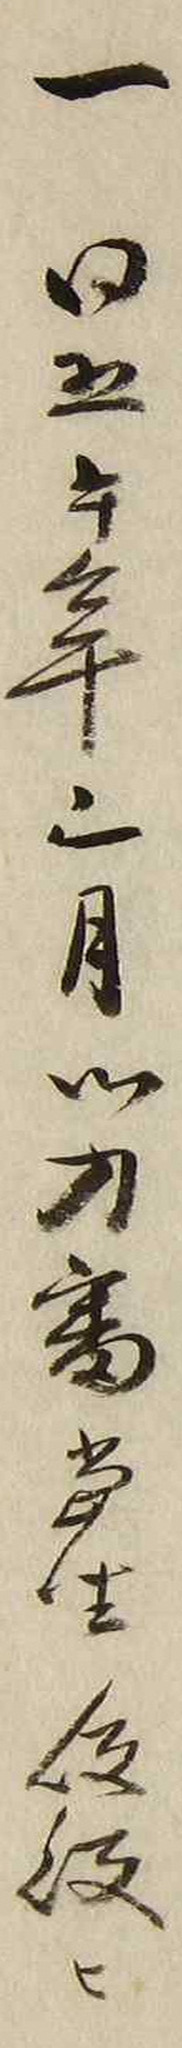一同五午年三月御刀番当座仮役被

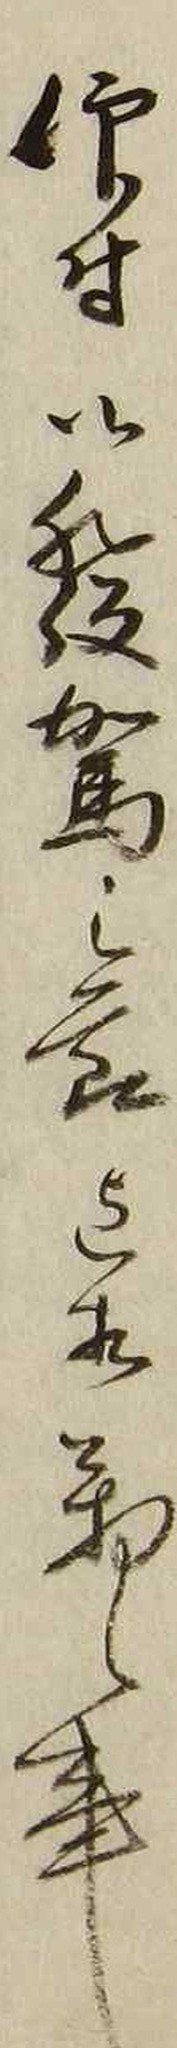仰付御発駕之節迄相勤候事
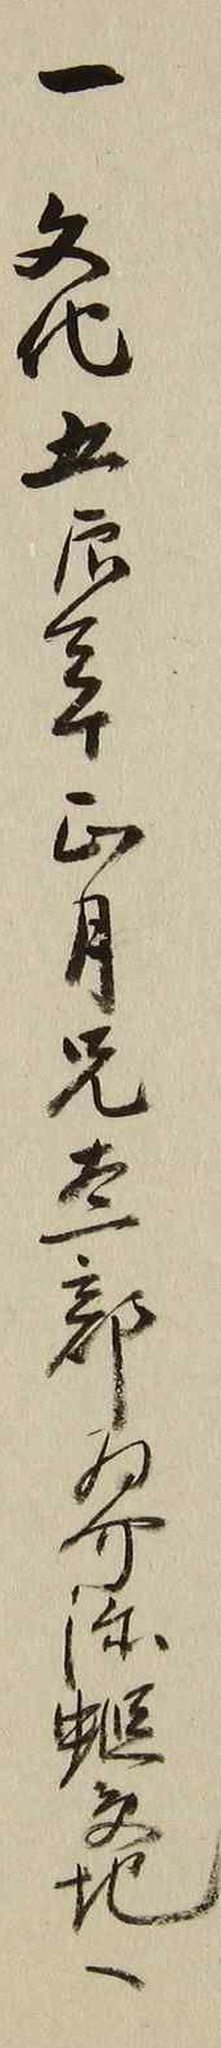一文化五辰年正月兄太一郎為介添蝦夷地へ
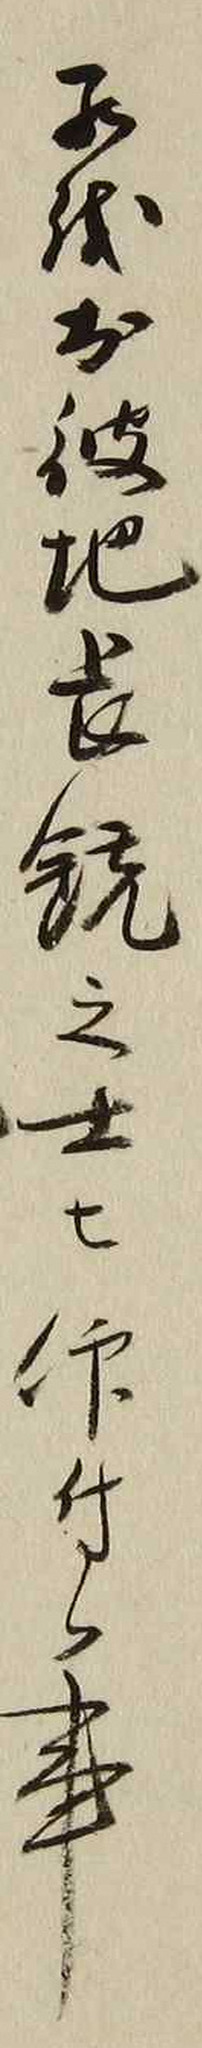罷越於彼地長銃之士被仰付候事
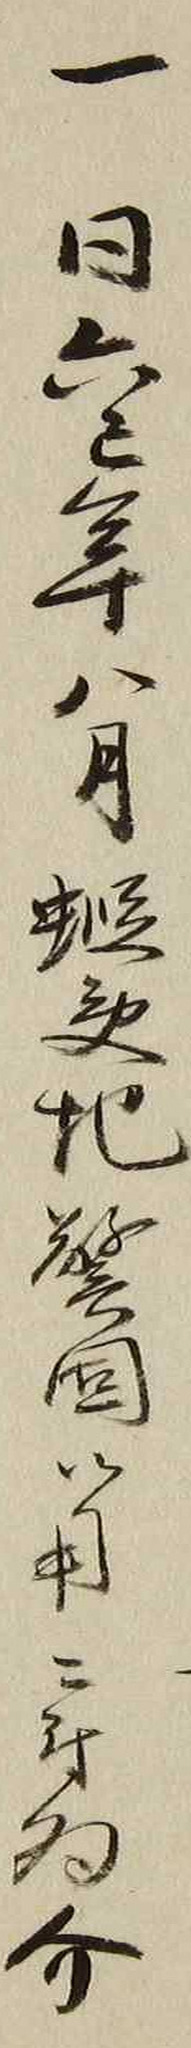一同六巳年八月蝦夷地警固御用ニ付為介
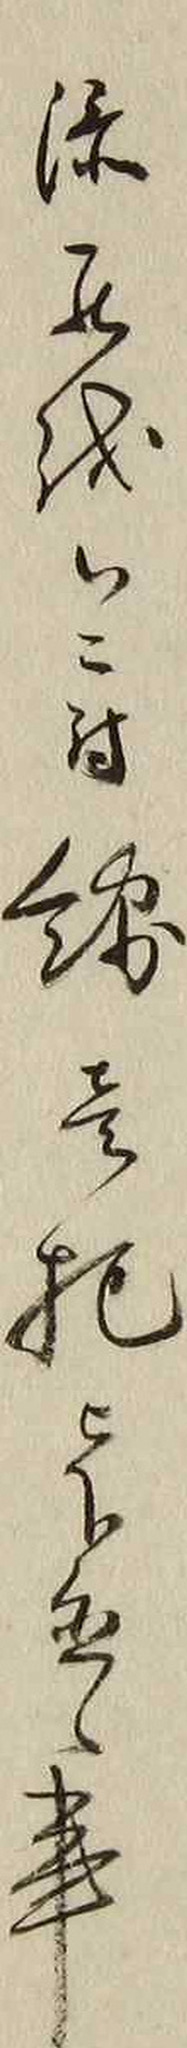添罷越候ニ付綿壱把被下置候事

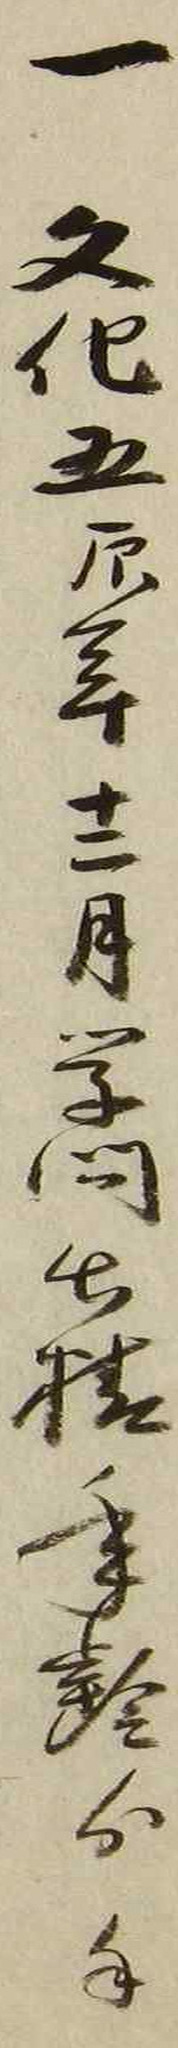一文化五辰年十二月学問出精年齢ゟ手
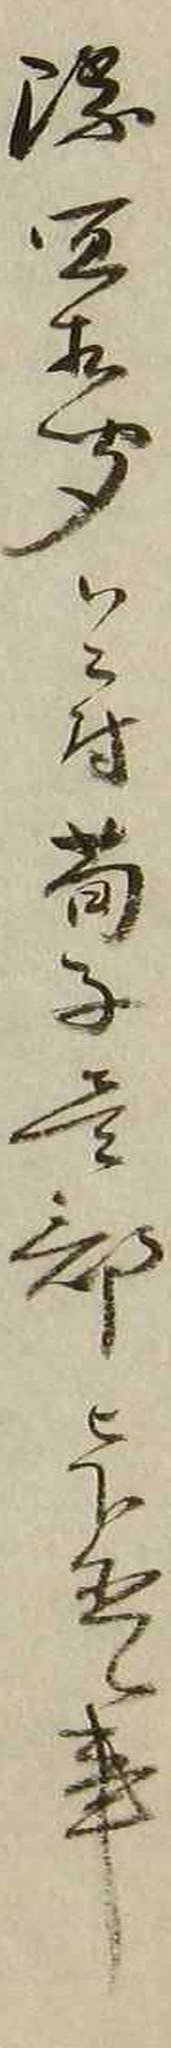際宜相聞候ニ付苟子壱部被下置候事
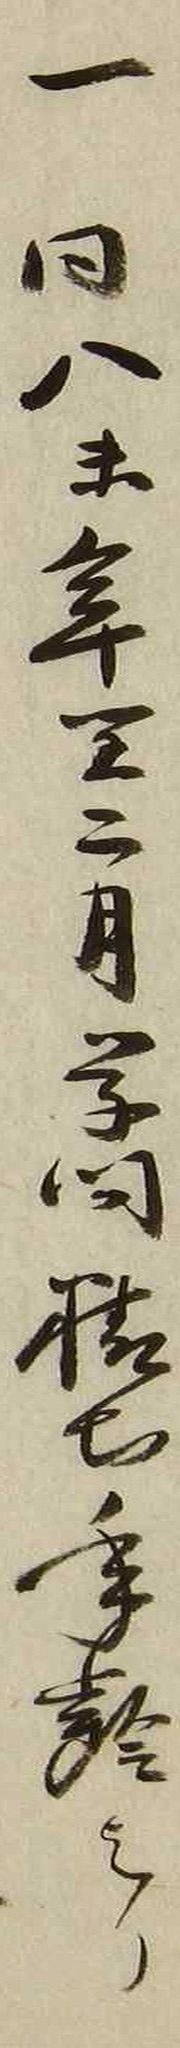一同八未年閏二月学問精出年齢より
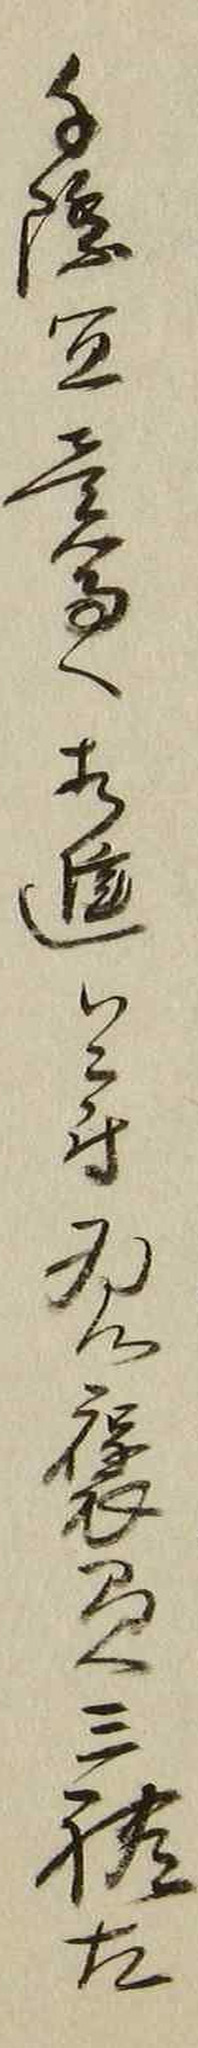手際宜壱等へ相進候ニ付為御褒美三礼古
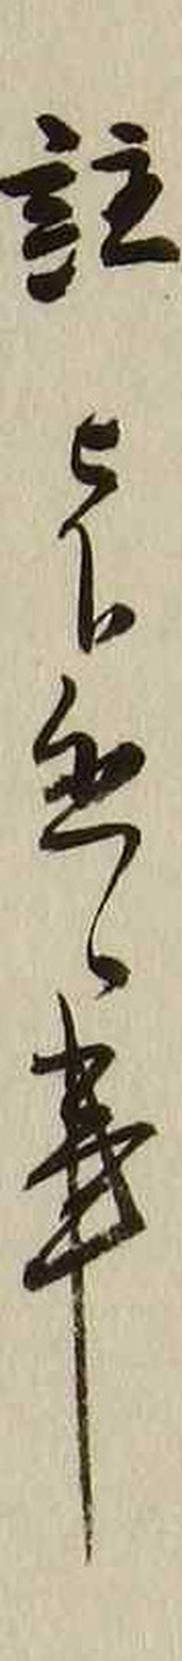註被下置候事
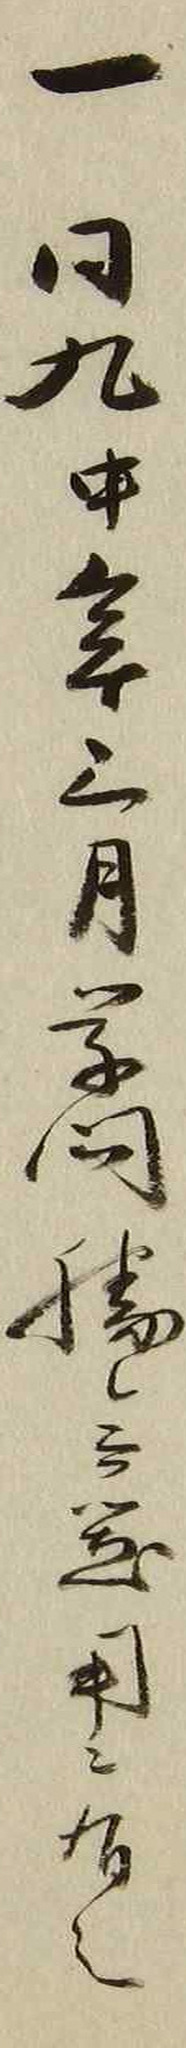一同九申年三月学問勝候而器用ニ有之
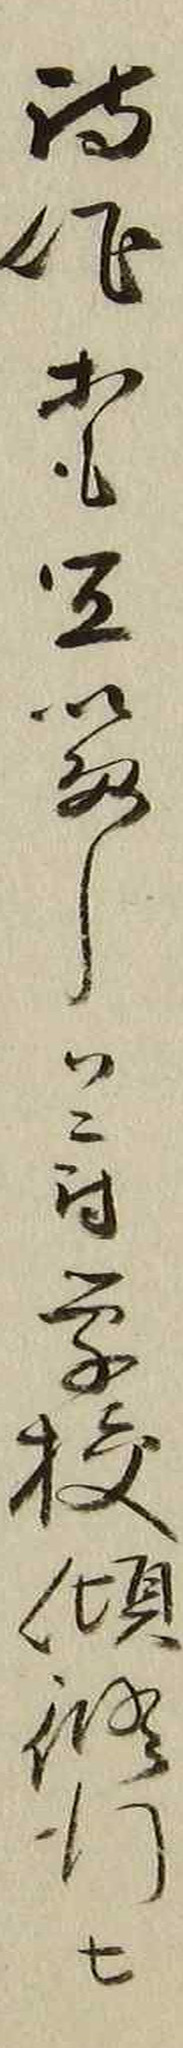詩作等も宜いたし候ニ付学校傾修行被
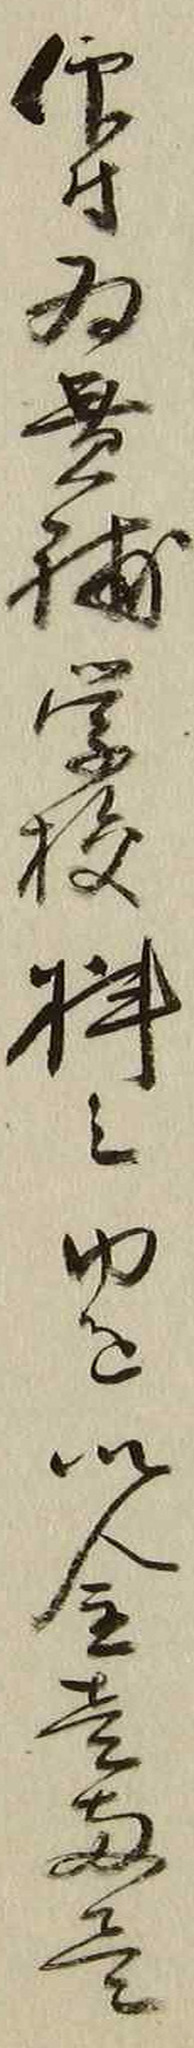仰付為費補学校料之内を以金壱両壱
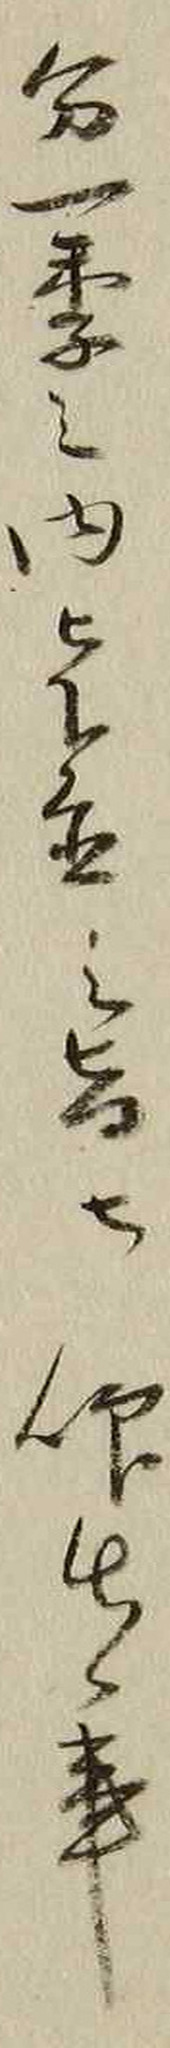分一季之内被下置之旨被仰出候事
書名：諸士系譜　巻之311　し之部1
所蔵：会津若松市立会津図書館
